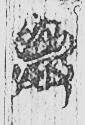䙴
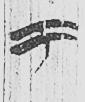于
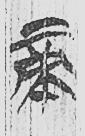帝
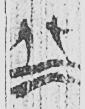丘
